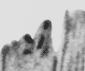兄
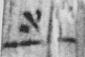之
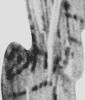所
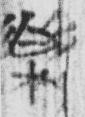樂
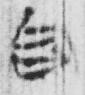句（苟）
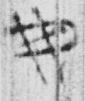母
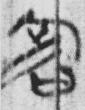害
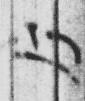少
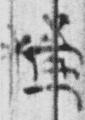○（枉）
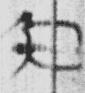内（入）
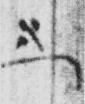之
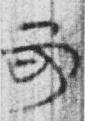可
